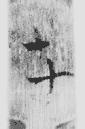{十七}
